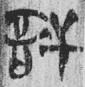訐（衍）
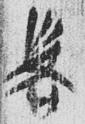○（徵）
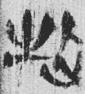牧
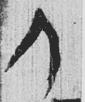人
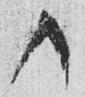人
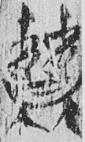蠶
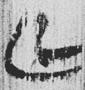亡
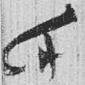氏
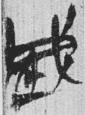城
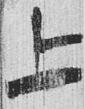上
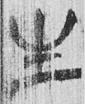生
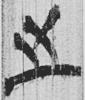之
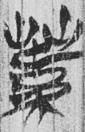葦
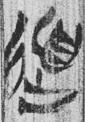道
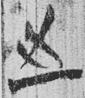之
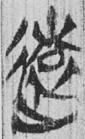遠
